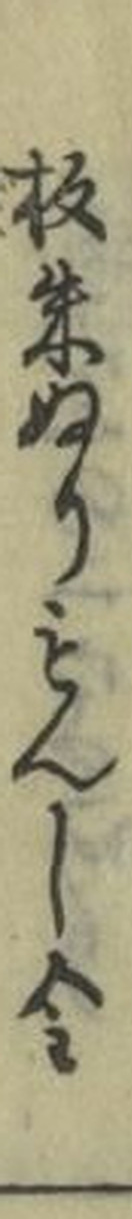板朱ぬりもんし金
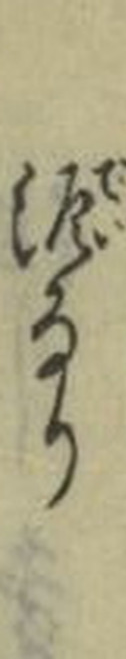泥なり
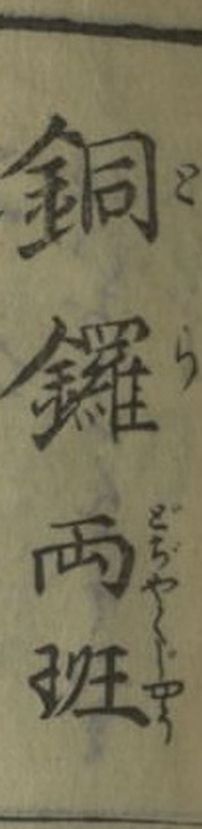銅鑼両班
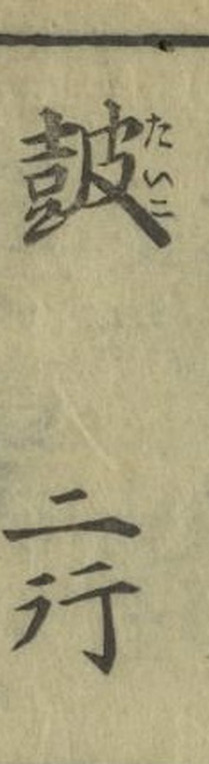鼓二行

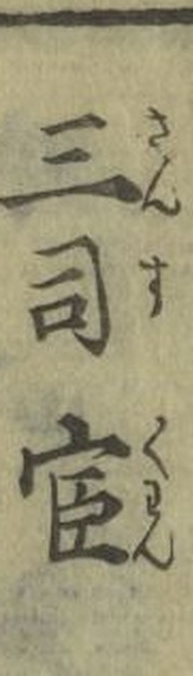三司宦
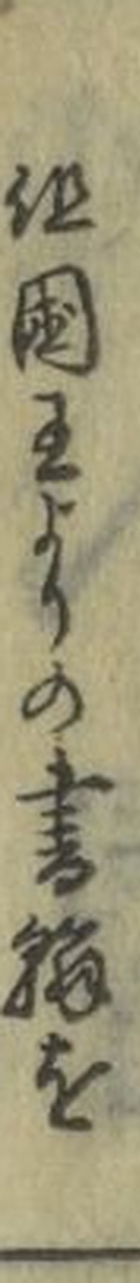但國王よりの書箱を
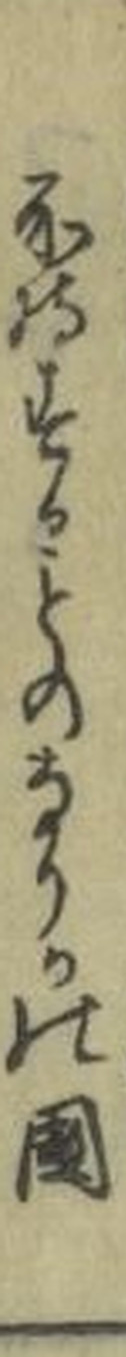所持するものなりかの國
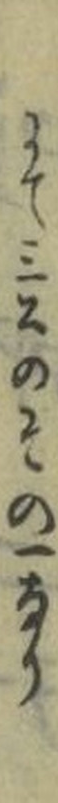にて三公のその一なり
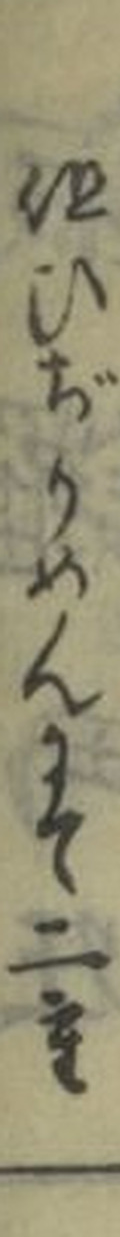但ひぢりめんにて二重
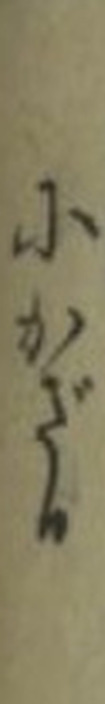にかざる
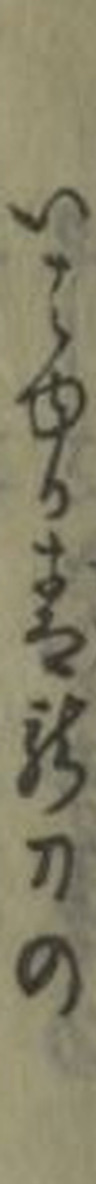いはゆる青龍刀の
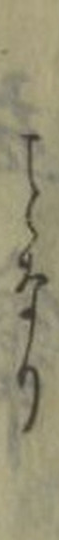ことなり
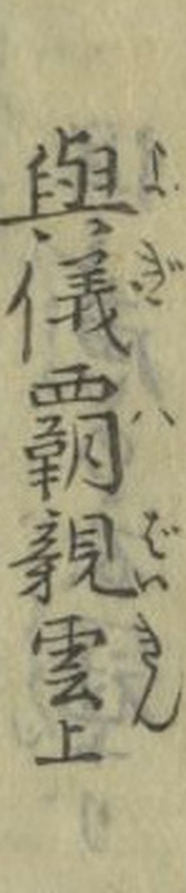與儀覇親雲上
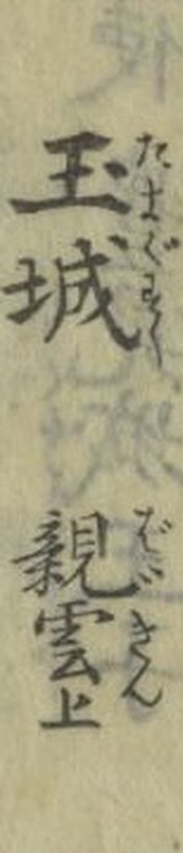玉城親雲上
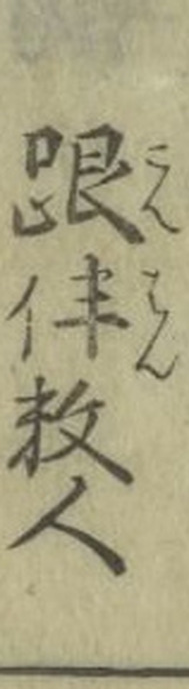跟伴数人
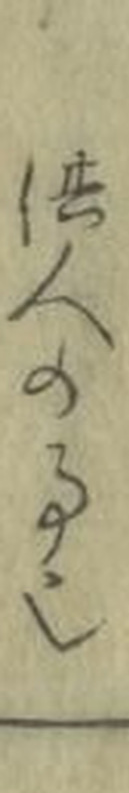供人の事也
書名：新板 琉球人行列記
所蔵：University of the Ryukyus Library
